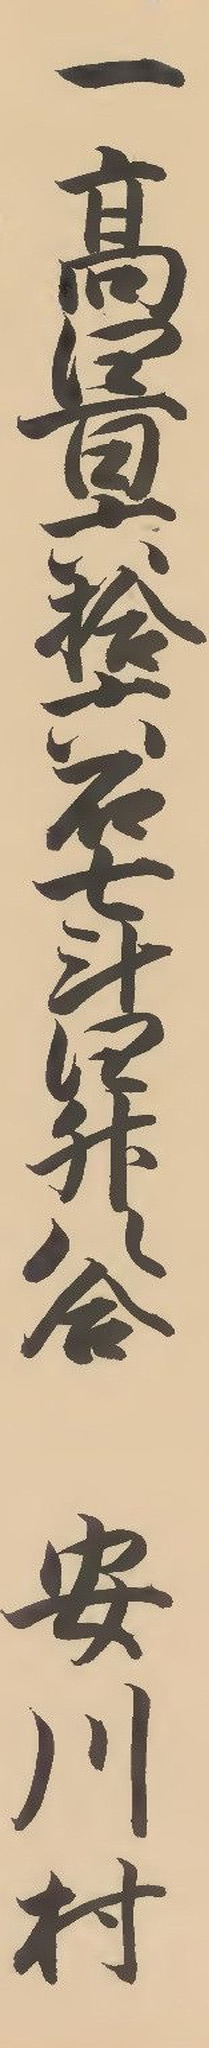一髙四百六拾六石七斗四升八合安川村
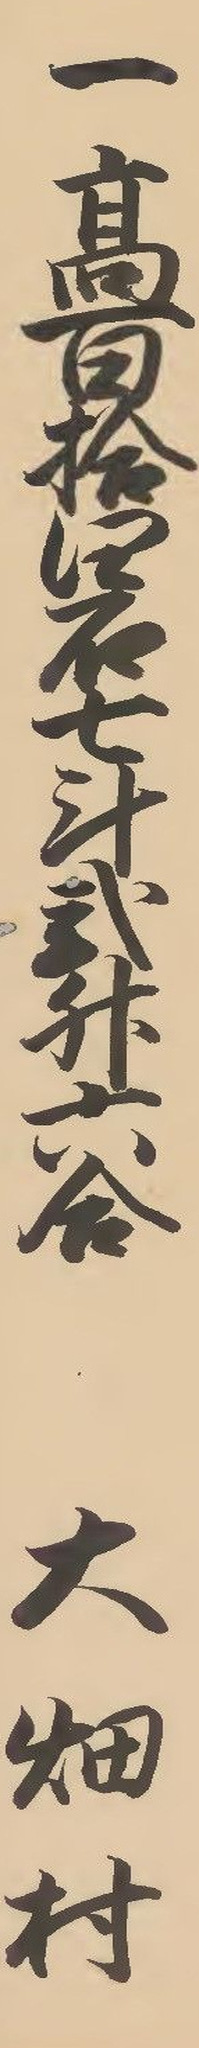一髙百拾四石七斗弐升六合大畑村
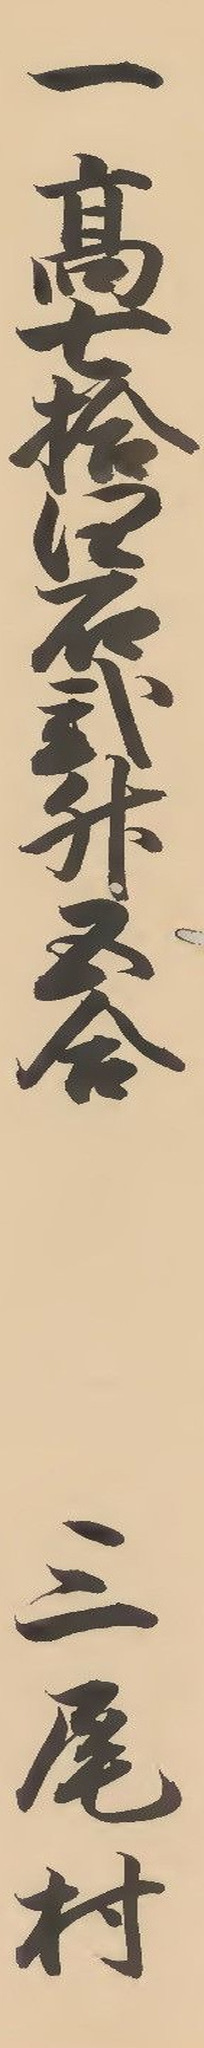一髙七拾四石弐升五合三尾村
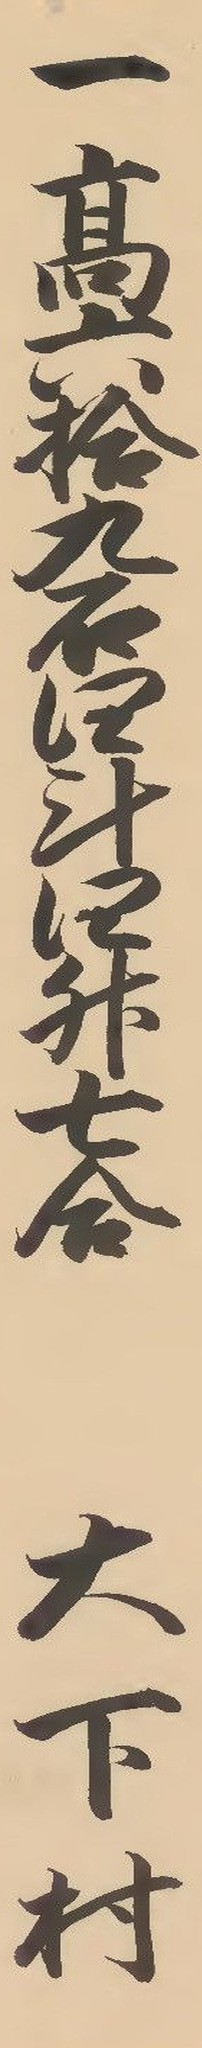一髙六拾九石四斗四升七合大下村
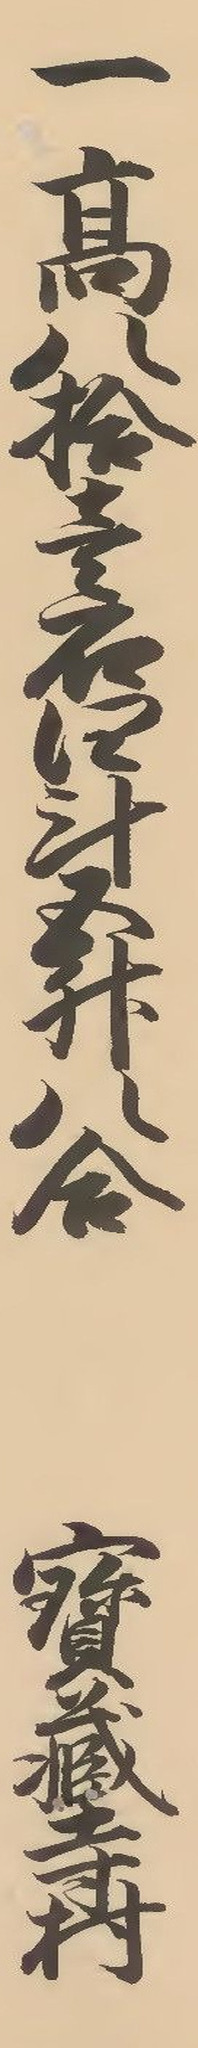一髙八拾壱石四斗五升八合寳藏寺村
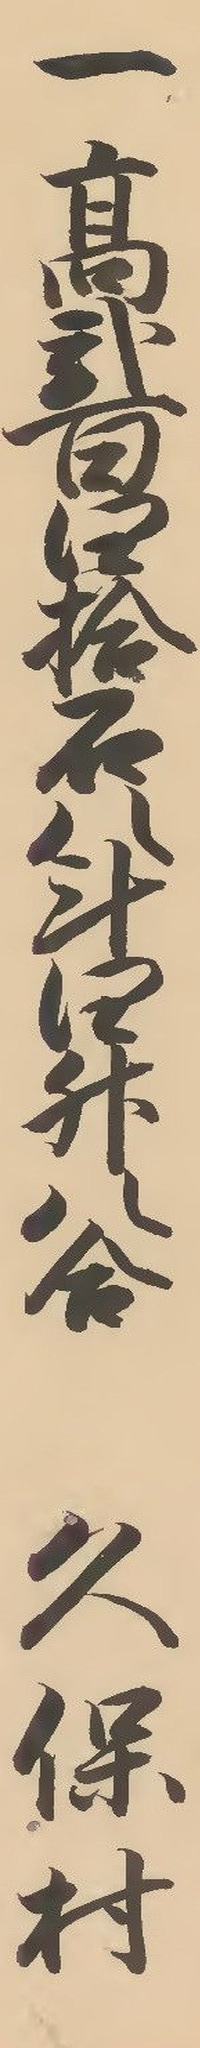一髙弐百四拾石八斗四升八合久保村

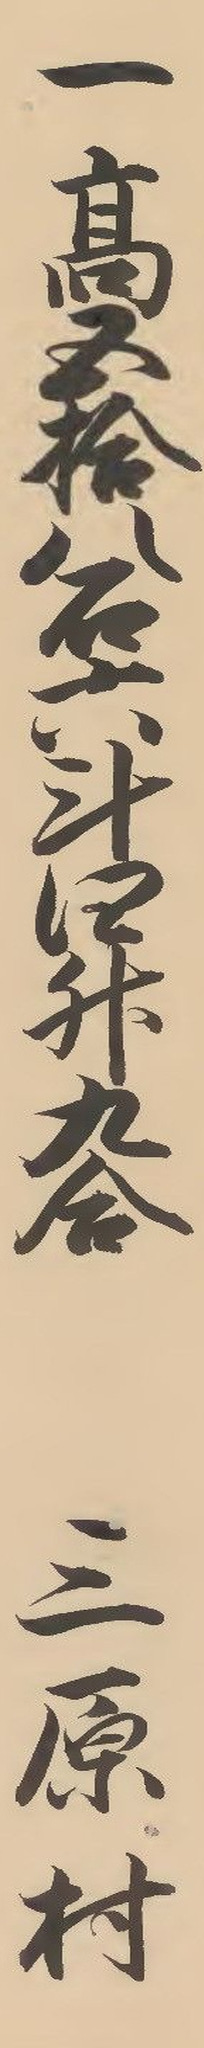一髙五拾八石六斗四升九合三原村
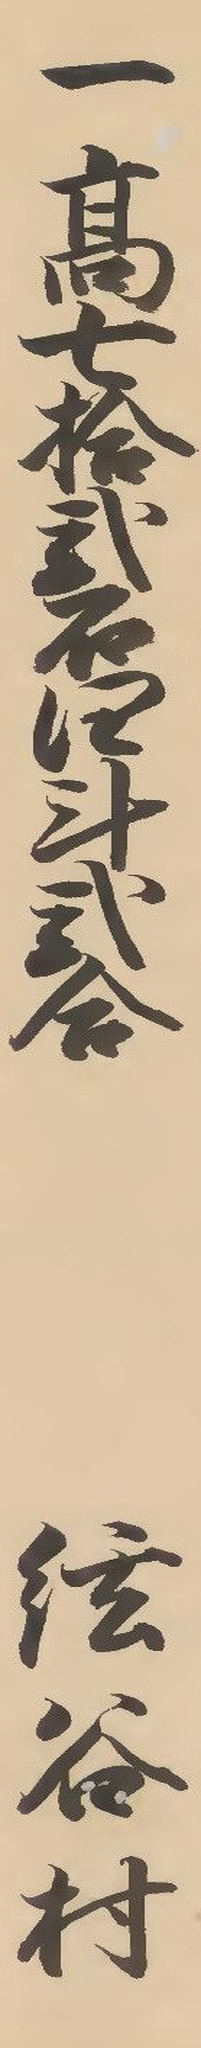一髙七拾弐石四斗弐合弦谷村
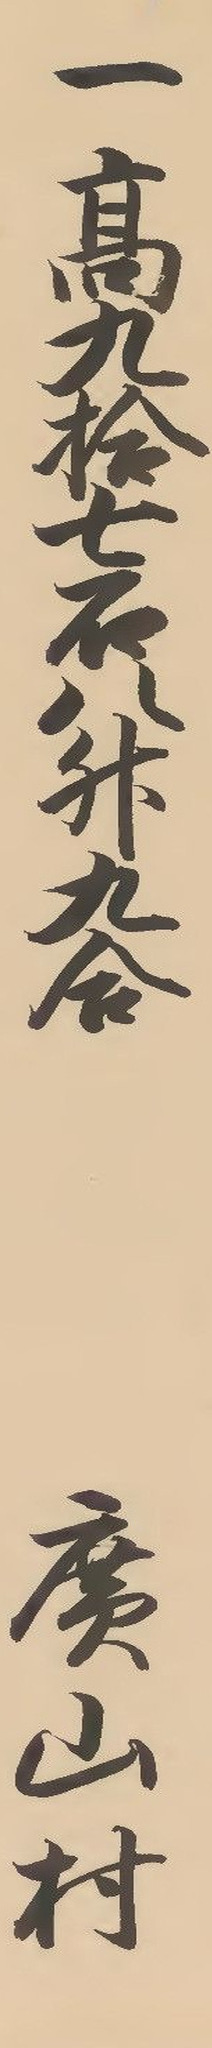一髙九拾七石八升九合廣山村
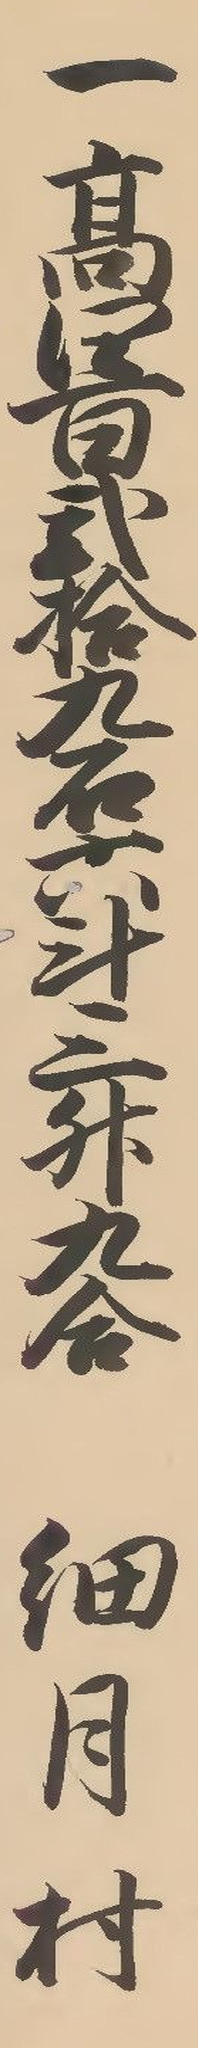一髙四百弐拾九石六斗三升九合細月村
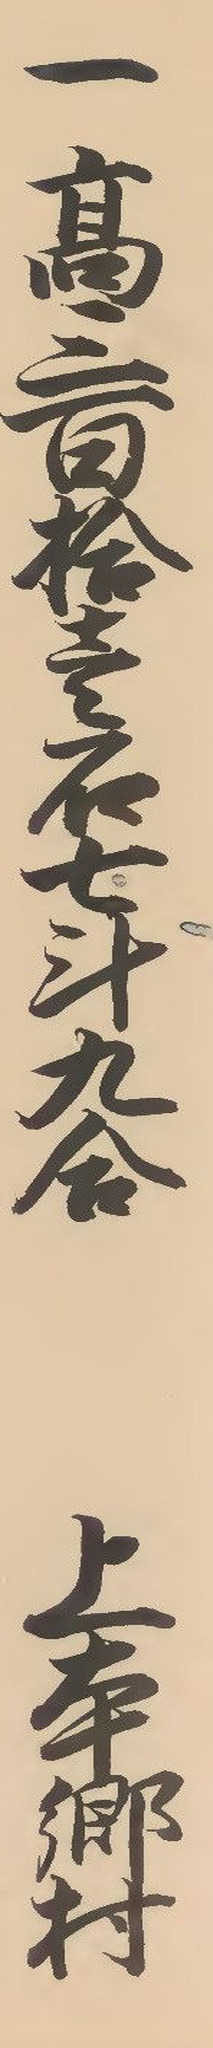一髙三百拾壱石七斗九合上本郷村
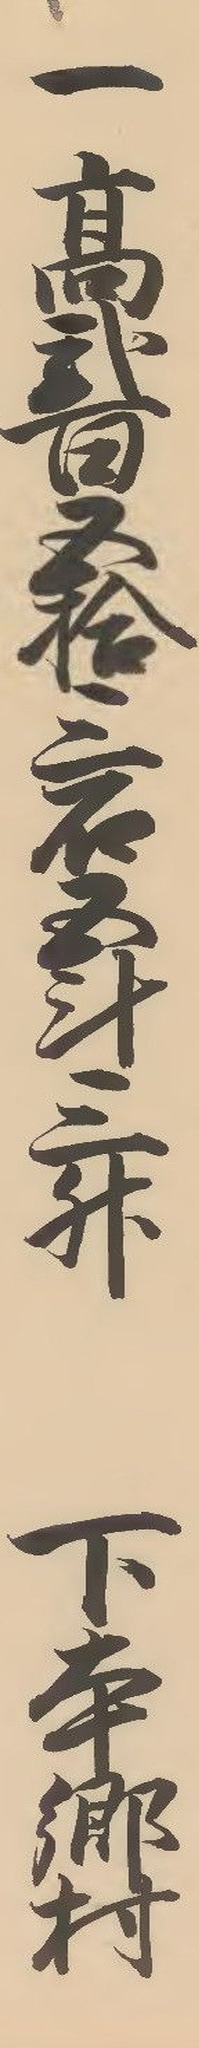一髙弐百五拾三石五斗三升下本郷村
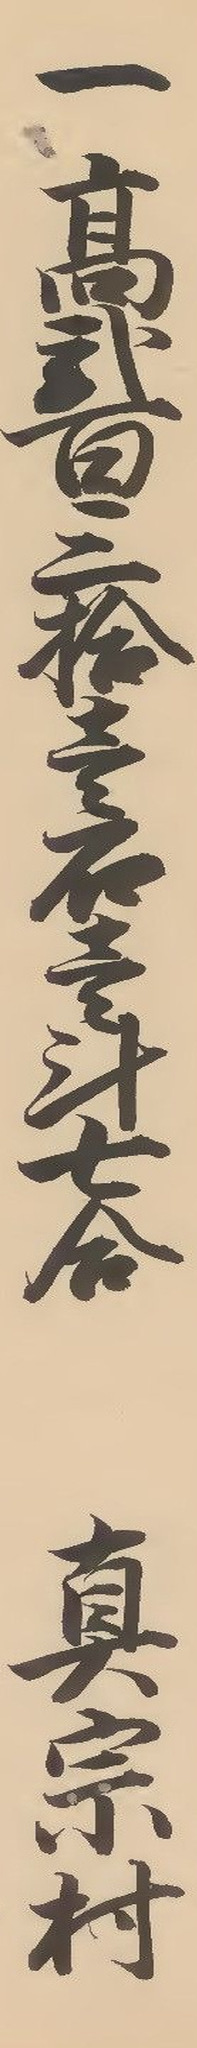一髙弐百三拾壱石壱斗七合真宗村
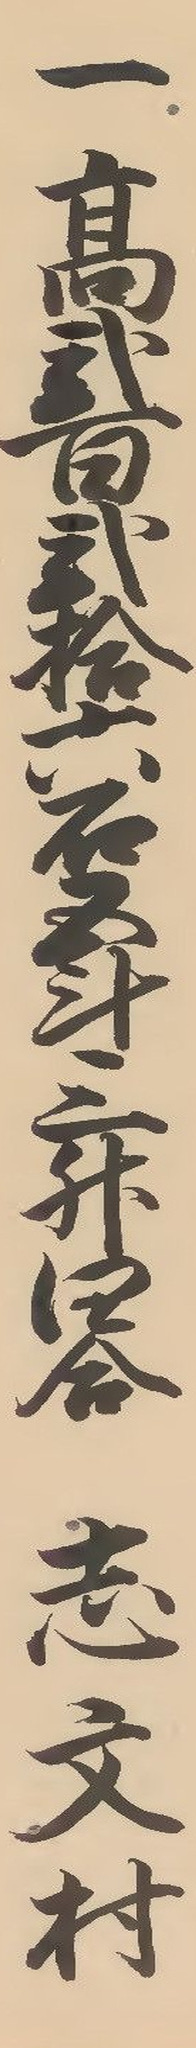一髙弐百弐拾六石五斗三升四合志文村

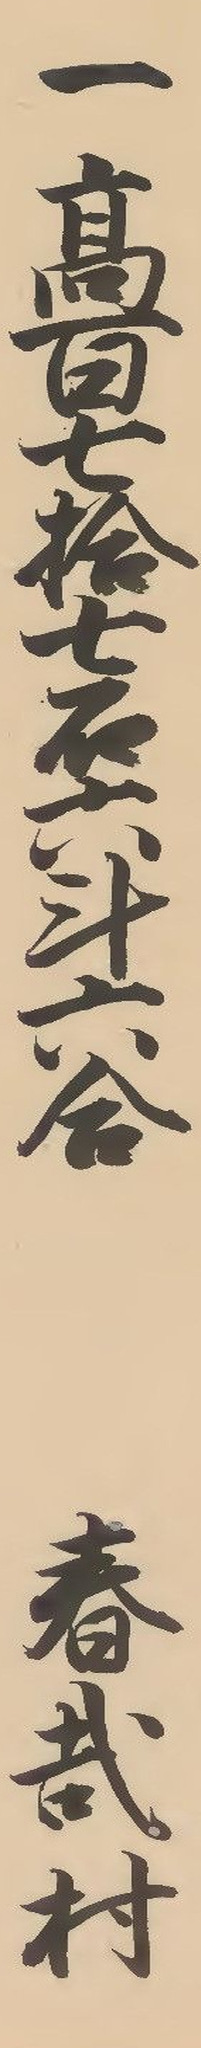一髙百七拾七石六斗六合春哉村
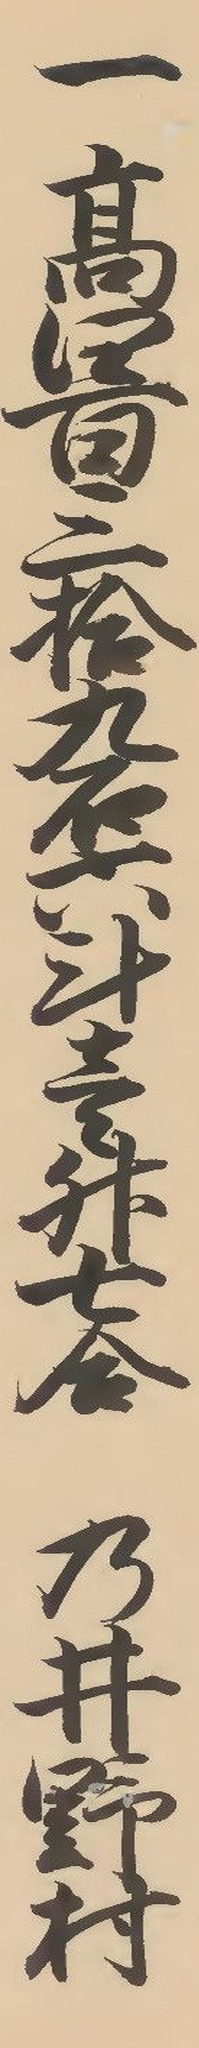一髙四百三拾九石六斗壱升七合乃井野村
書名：播磨国郷帳
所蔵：国立公文書館 National Archives of Japan
